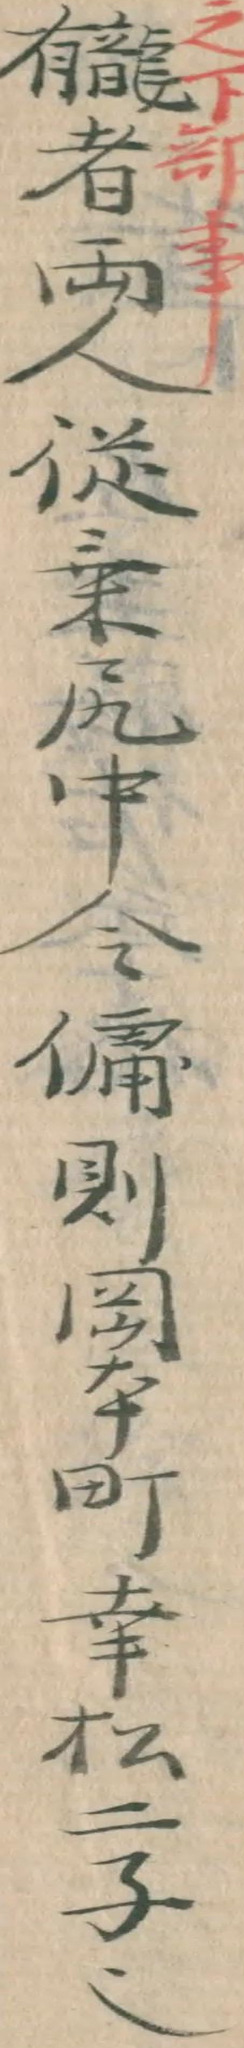龓者両人従乗尻中令傭則岡本町幸松二子也
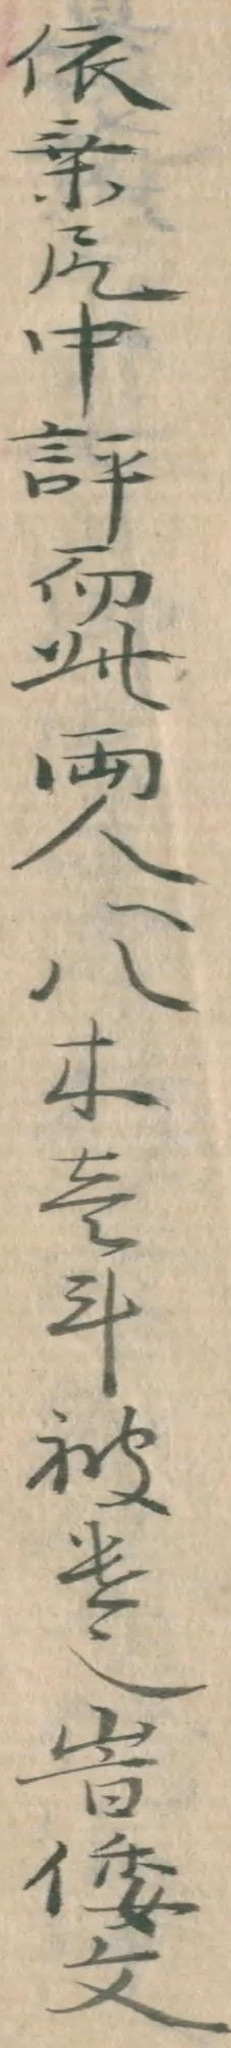依乗尻中評而此両人へ八木壱計被遣也旹倭文
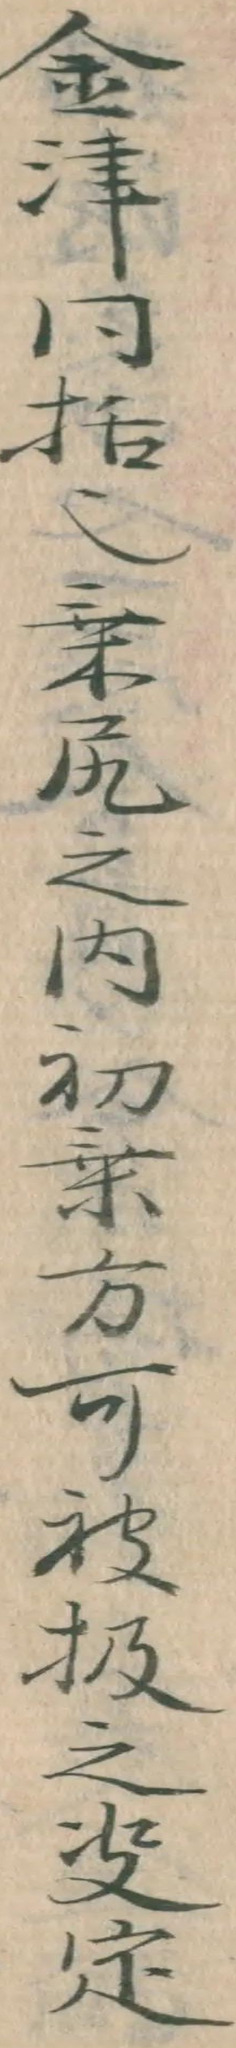金津同括也乗尻之内初乗方可被扱之決定
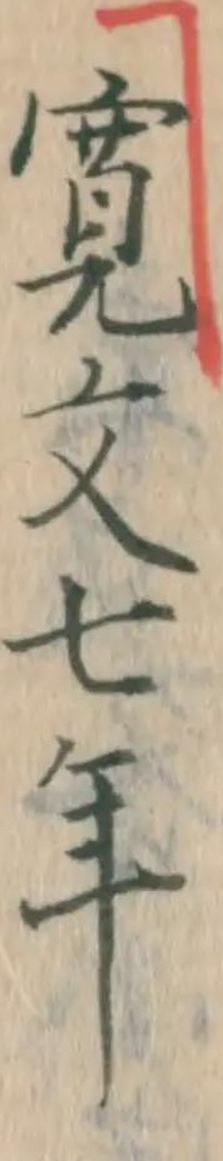寛文七年
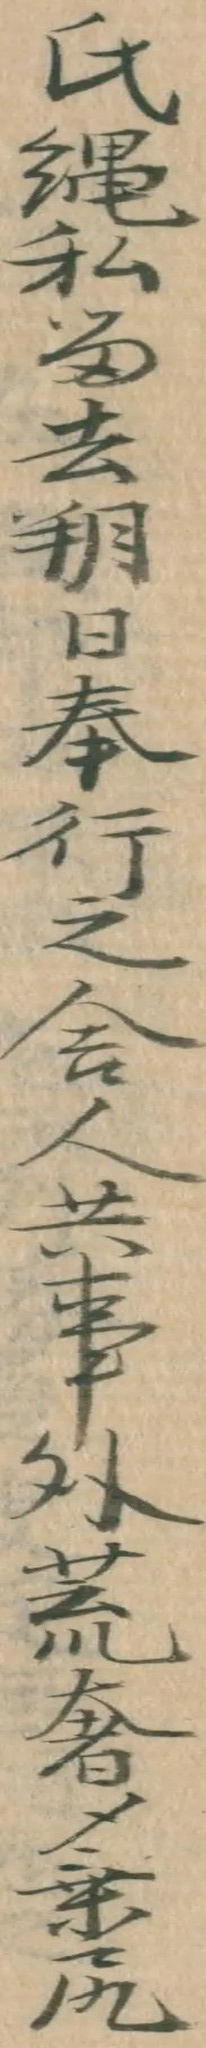氏縄私留去朔日奉行之舎人共事外荒奢シテ乗尻
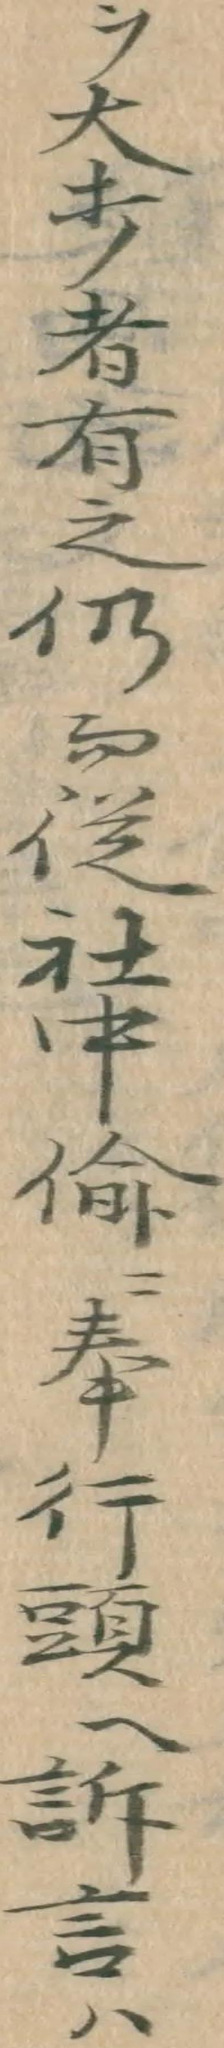ヲ大打者有之仍而従社中倫ニ奉行頭へ訴言ハ
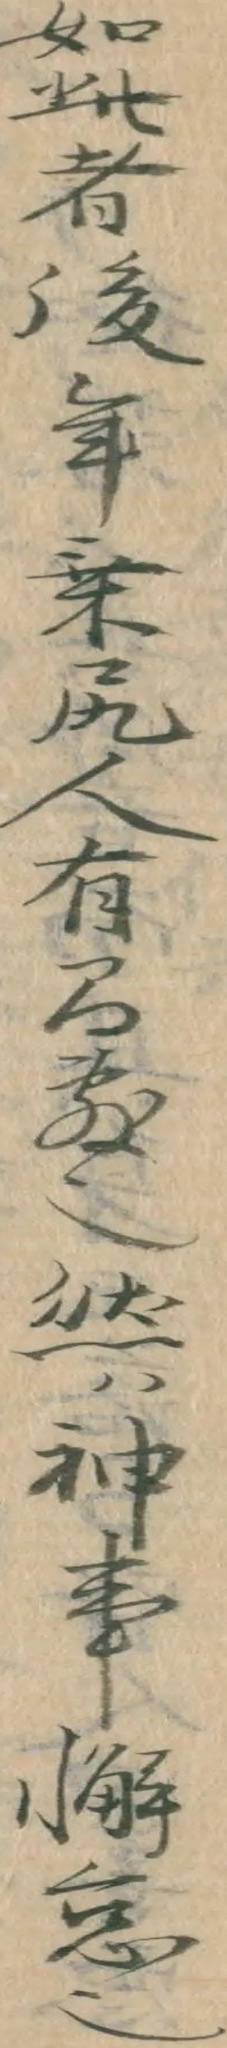如此者後年乗尻人有間敷也然ハ神事懈怠也
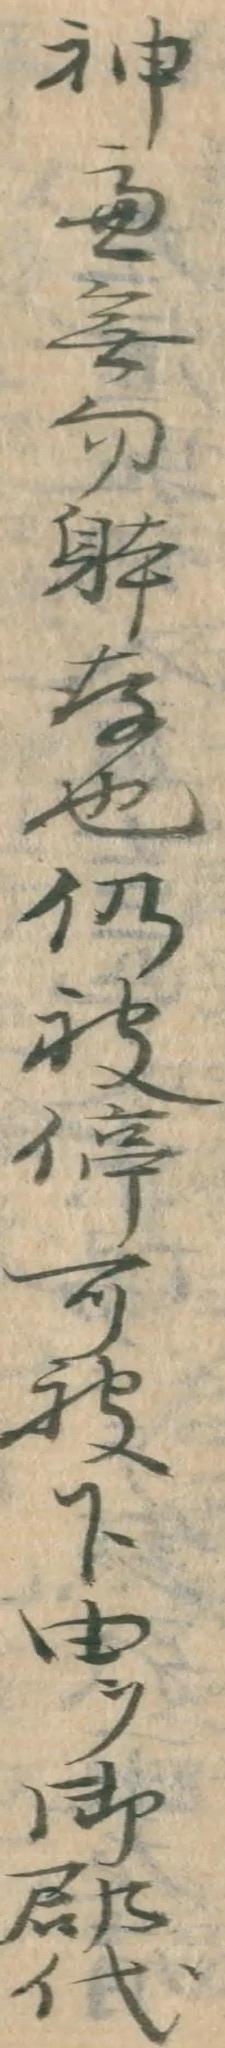神通無勿体存也仍被停可被下由ヲ御郡代
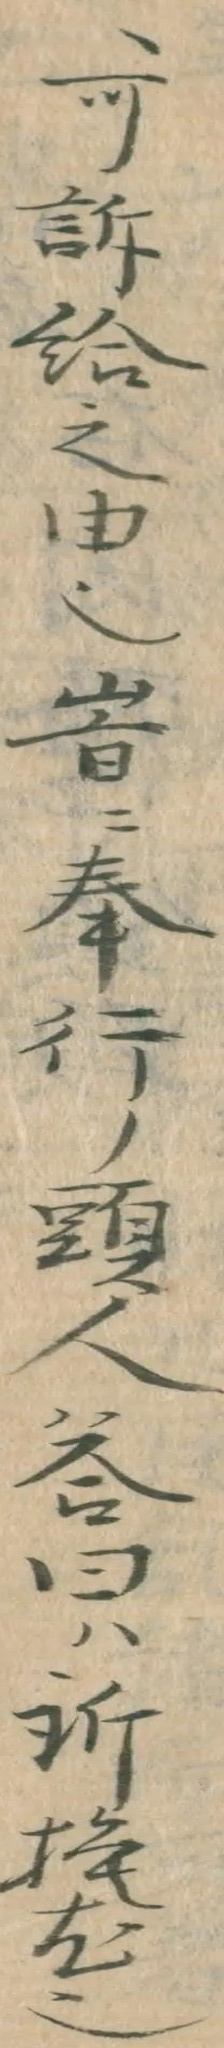ヘ可訴給之由也旹ニ奉行ノ頭人答曰ハ訴捨尤也
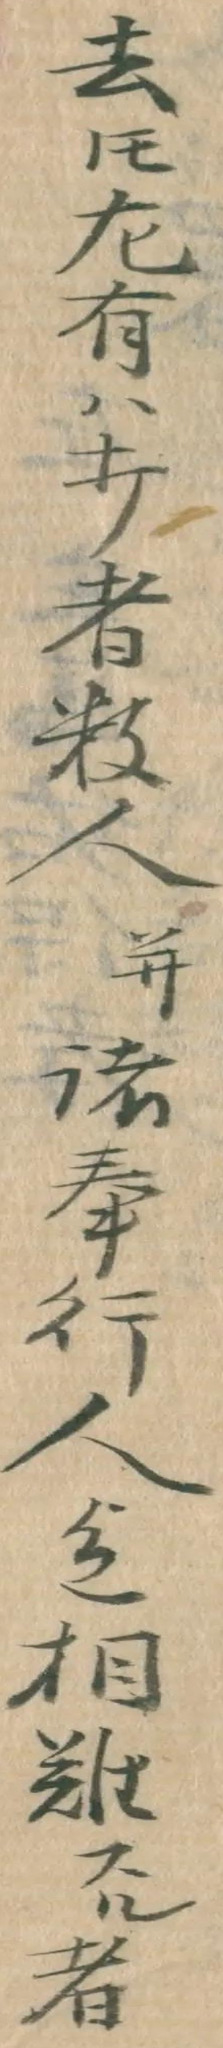去トモ左有ハ打者数人并諸奉行人迄相難スル者
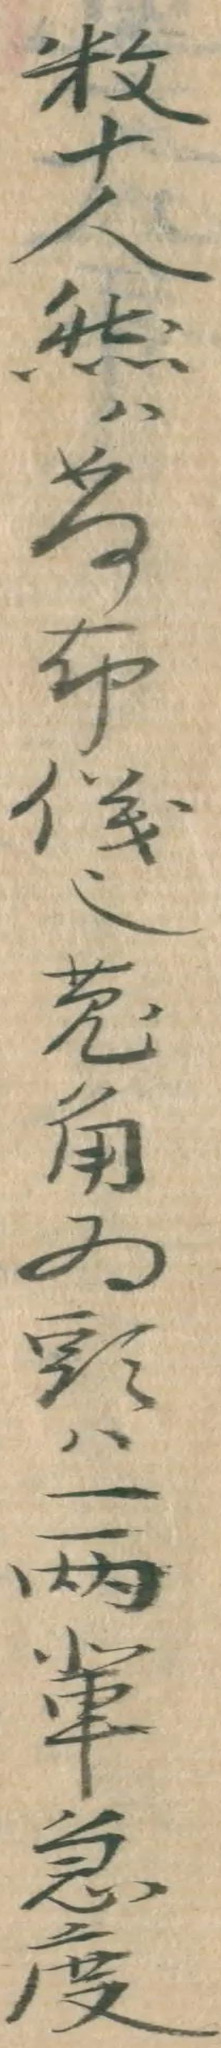数十人然ハ如何布儀也兎角為頭ハ一両輩急度
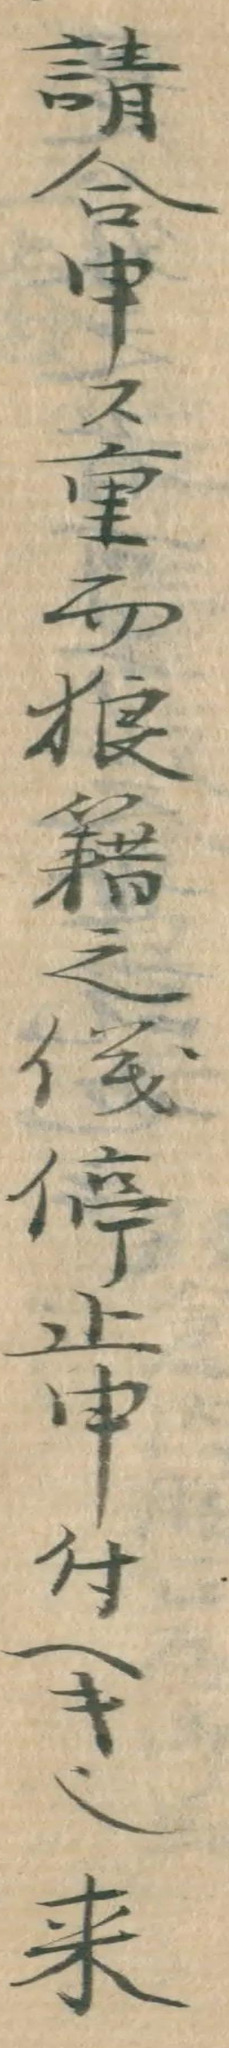請合申ス重而狼藉之儀停止申付ヘキ也来
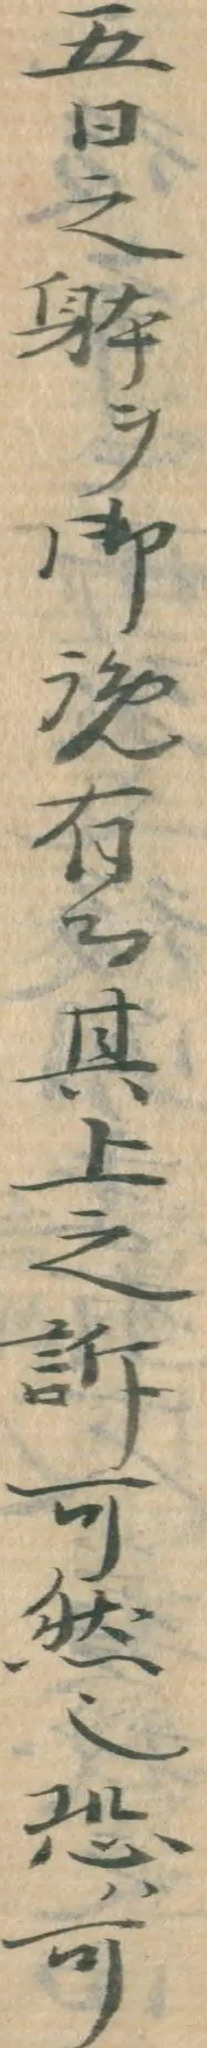五日之体ヲ御覧有而其上之訴可然也恐ハ可
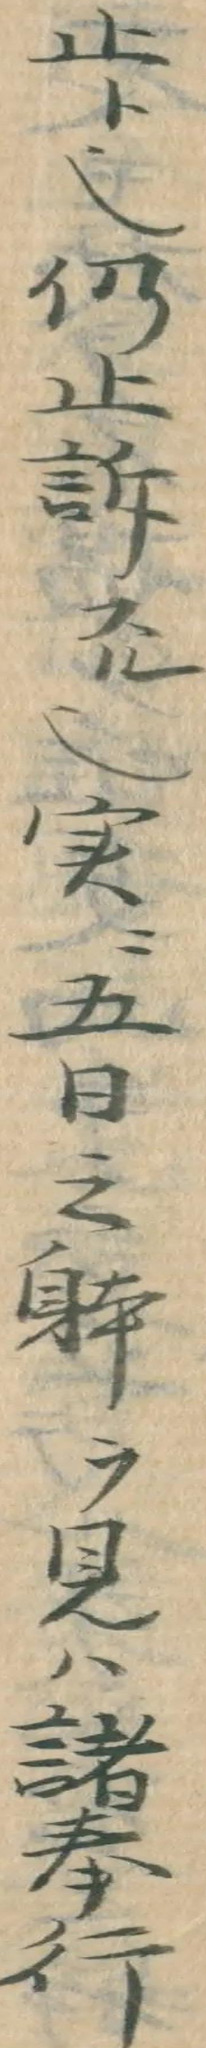止ト也仍止訴スル也実ニ五日之体ヲ見ハ諸奉行

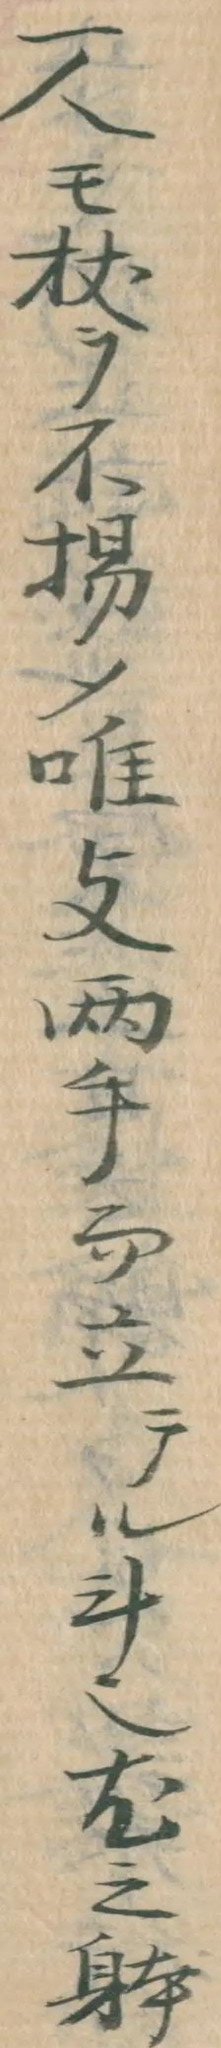一人モ杖ヲ不揚シテ唯支両手而立テル計也尤之体
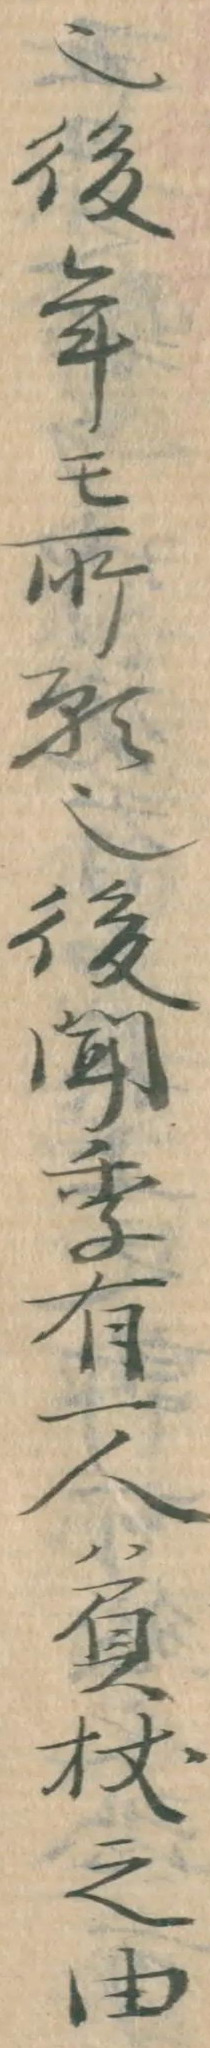也後年モ所願也後聞季有一人ハ負杖之由
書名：賀茂社記録. 第10冊
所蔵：国立国会図書館 National Diet Library, JAPAN
